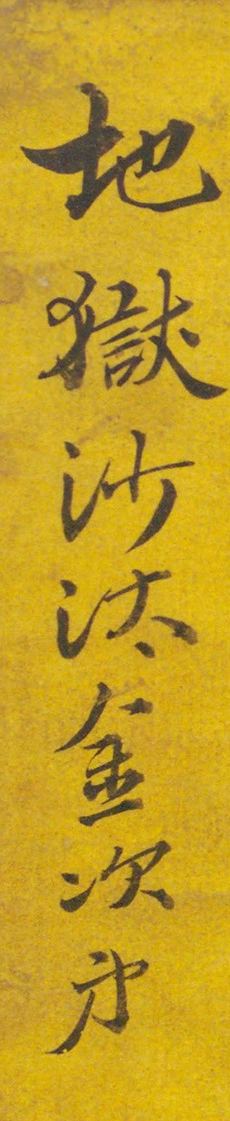地獄沙汰金次第

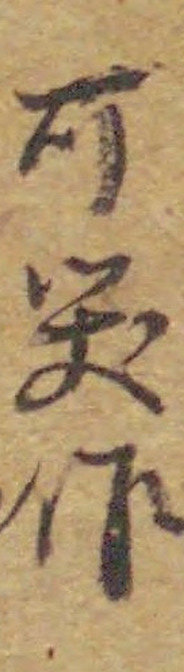可笑作

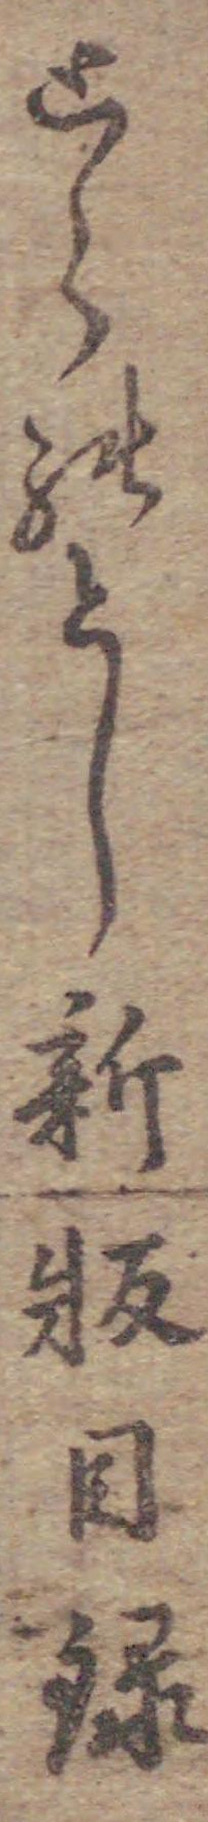とらのとし新版目録
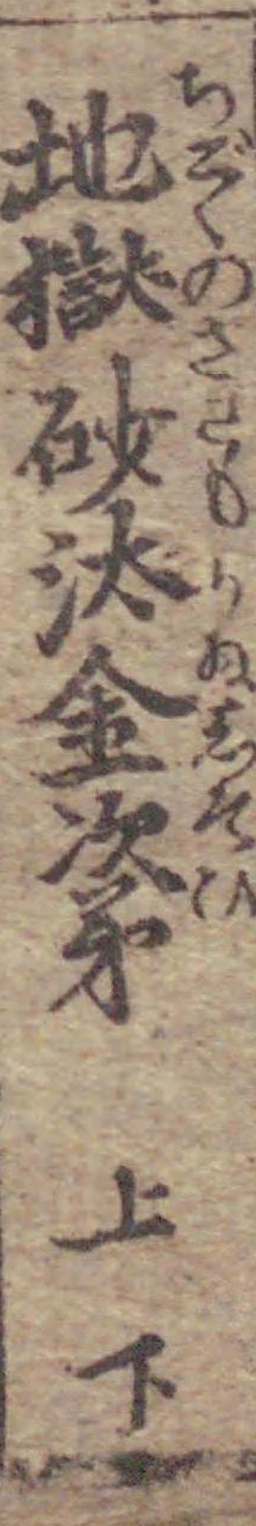地獄砂汰金次第上下
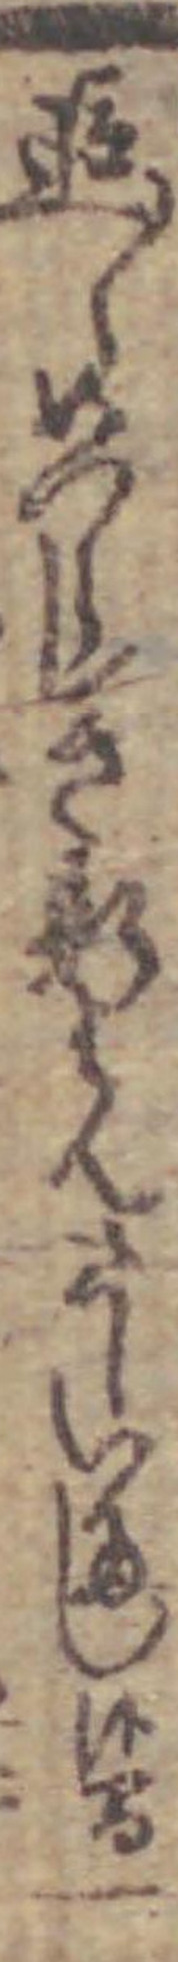追〳〵めつらしき新はんたしいまし候間
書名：地獄沙汰金次第 : 2巻
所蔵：国立国会図書館 National Diet Library, JAPAN
